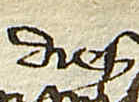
dieſ*
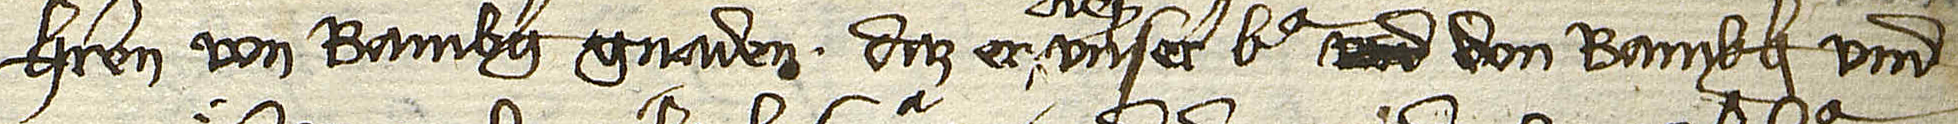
h*ren von Bamb*g gnaden . daʒ er vnſer* b* vnd von Bamb*g vnd
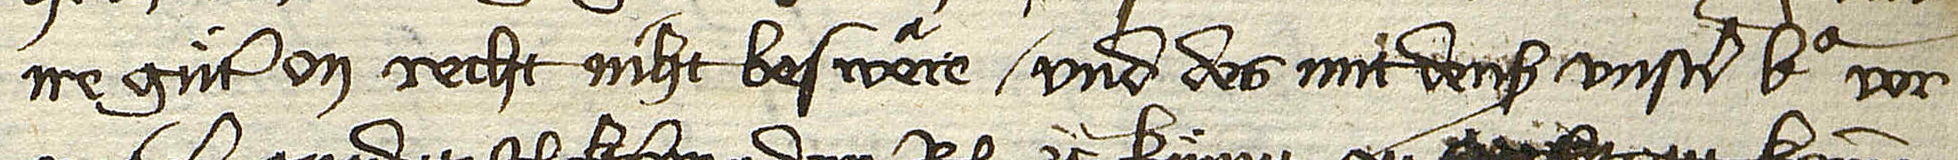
ire güt* on recht niht beſwëre / vnd des mit denſ* vnſ*n b* vor
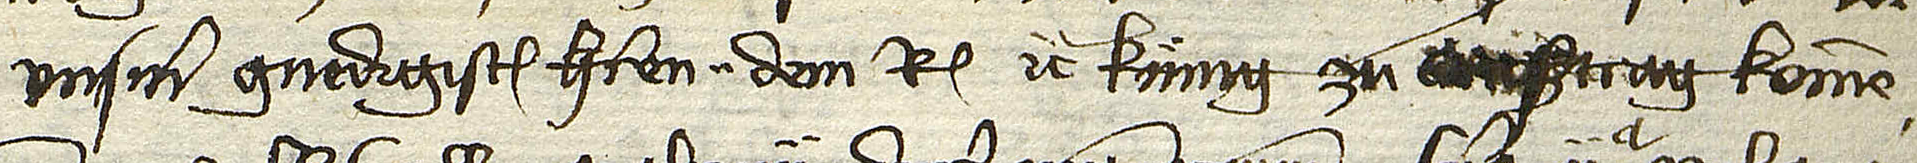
vnſ*m gnedigiſt* h*ren ~ dem R* ec* künig ʒu auſʒtrag kome*
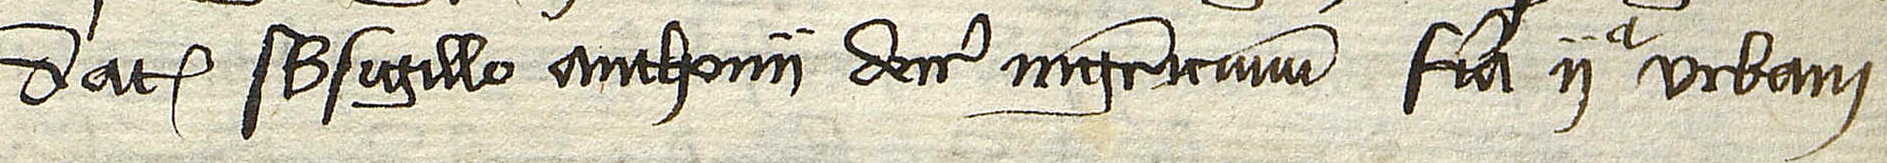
dat* ſ*B ſigillo anthonii derr* m*g*r*iciuiu* fia* ii* vrbani
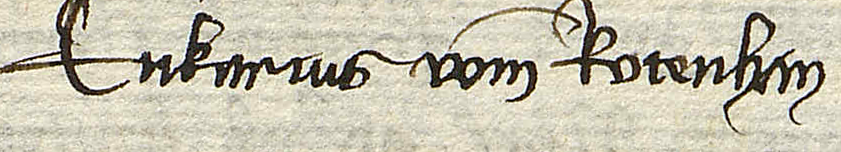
Eukarius vom* Rotenhan
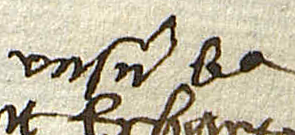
vnſ*n b*
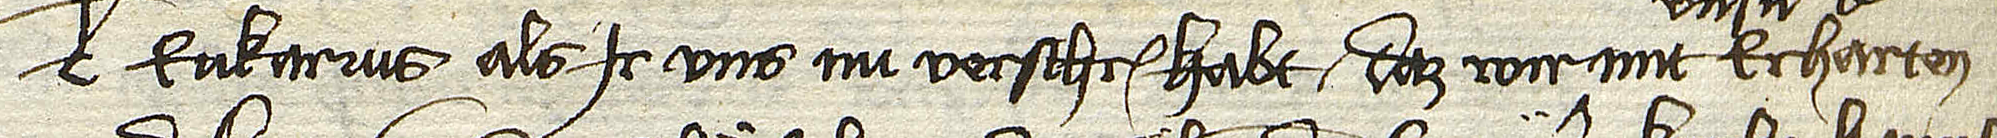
L* Eukarius als Ir vns verſchr* habt / daʒ wir mit Erharten
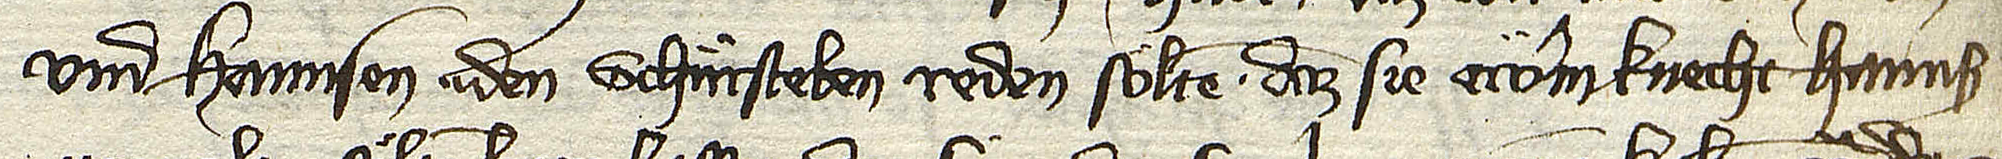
vnd hannſen ~ den Schürſteben reden ſölte* . daʒ ſie ew*m knecht hannſ*
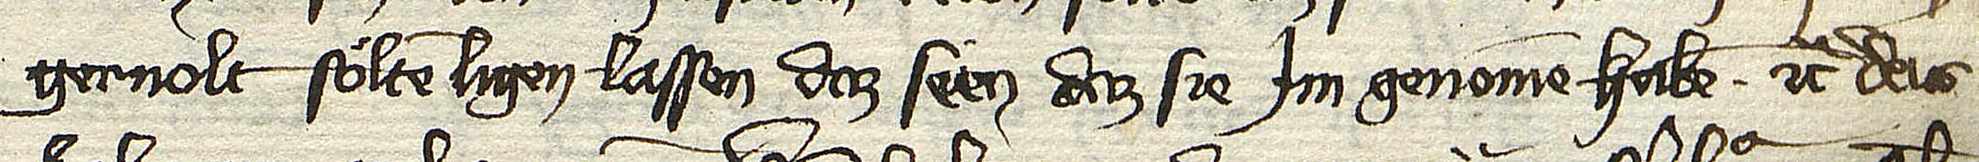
gernolt ſölte* ligen laſſen daʒ ſeien daʒ ſie Im genome* habe* . ec* das
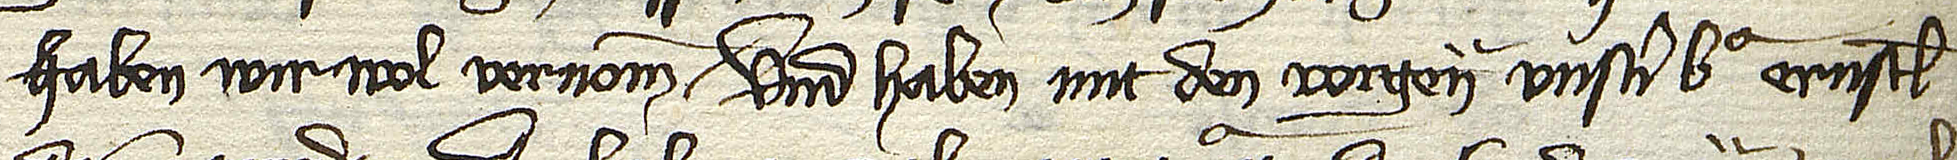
haben wir wol vernom* / Vnd haben mit den vorgen* vnſ*n b* ernſtl*
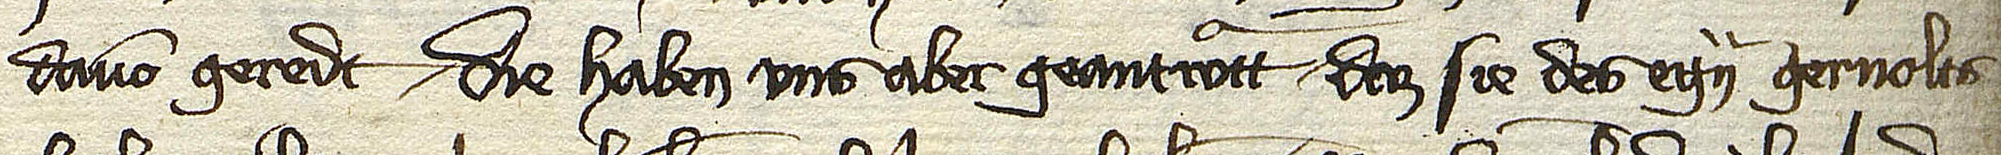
dauo* geredt / Die haben vns aber geantw*tt / daʒ ſie des eg*n gernolts
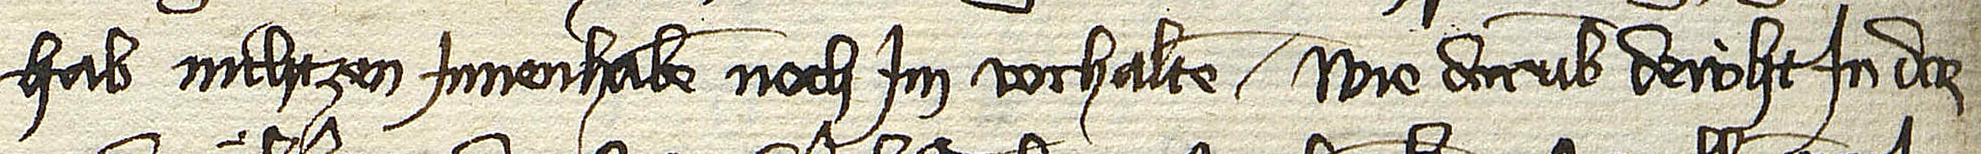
habe nichcʒen Innenhabe* noch Im vorhalte* / wie daru*b dewcht In die
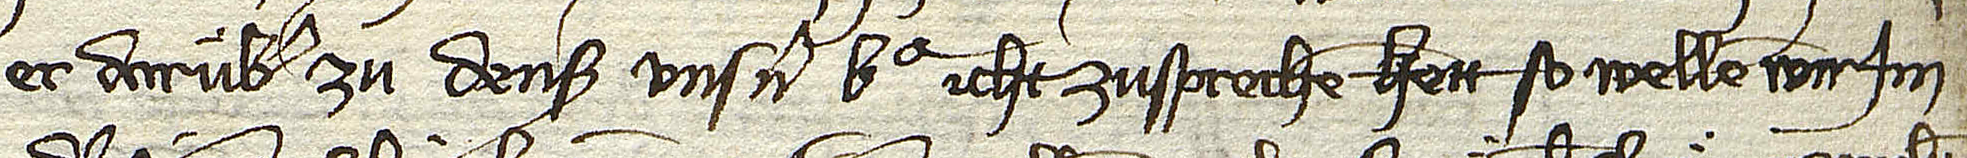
er darüb* ʒu denſ* vnſ*n b* icht ʒuſpreche* hett ſo welle* wir Im
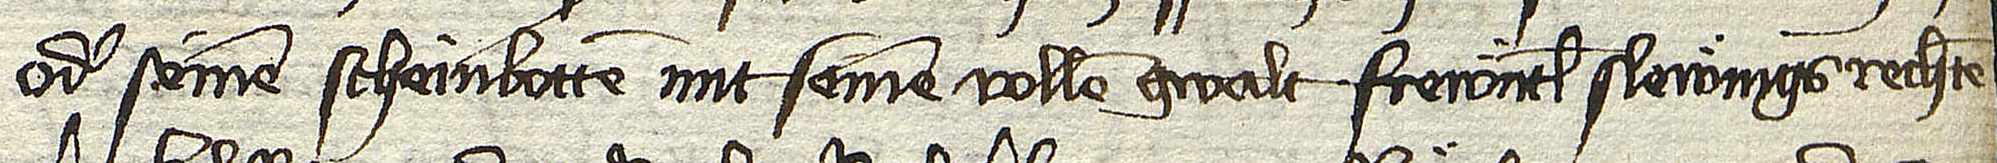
od* ſeine* ſcheinbotte* mit ſeine* volle* gwalt . frewntl* ſlewnigs rechte*
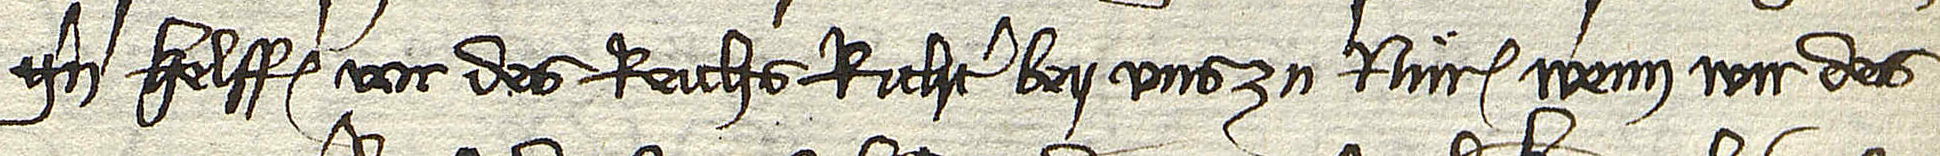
g*n helff* vor des Reichs Richt* bey vns ʒu Nür* wenn wir des
